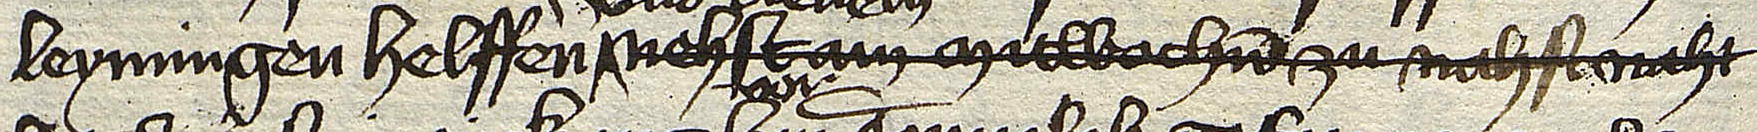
leymingen helffen nehſt am Mitwoch*n cʒu nahſt naht
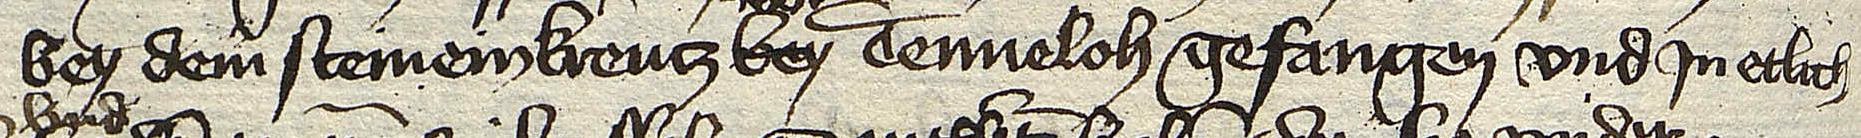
bey dem ſteinenkreucʒ bey Tenneloh gefangen vnd In etlich
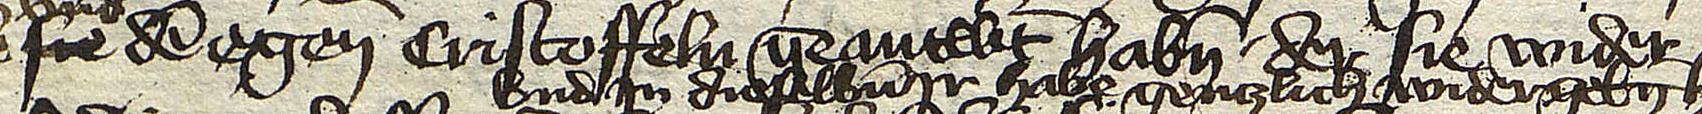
ſie d* egen* Criſtoffeln geantw*t hab*n / der ſie wider
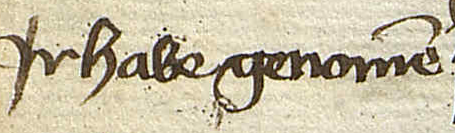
Ir habe genome*
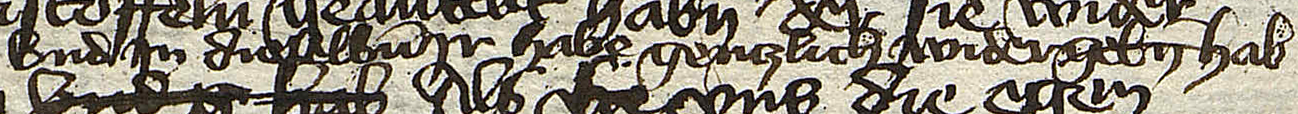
vnd in dieſelb*n Ir habe gencʒlich widergeb*n hab
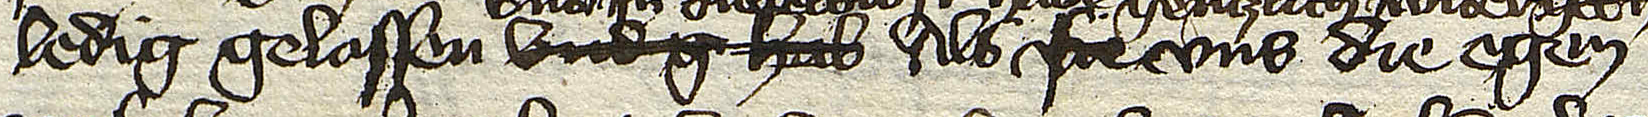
ledig gelaſſen vnd g* hab Als ſie vns die egen*
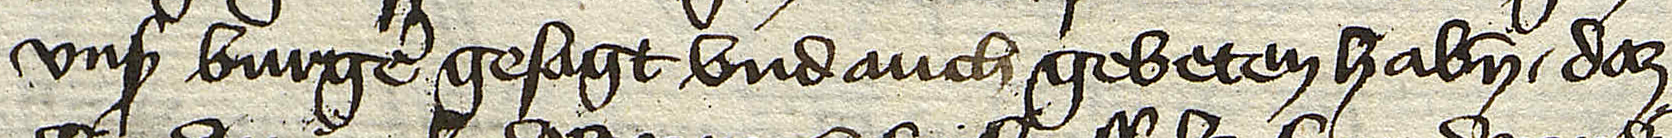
vnſ* burge* geſagt vnd auch gebeten hab*n / daʒ
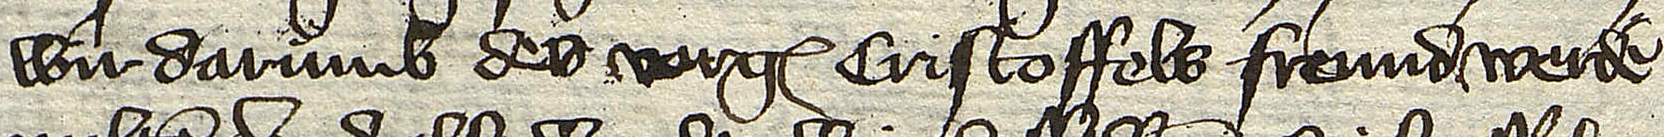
wir darümb des vorg* Criſtoffels frend werde*
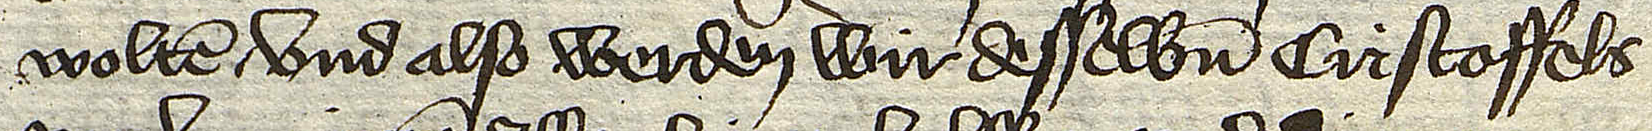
wolte* / vnd alſo werden wir deſſelb*n Criſtoffels
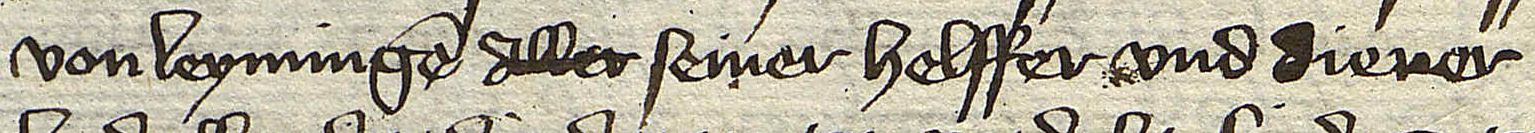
von leyminge* Aller ſeiner helffer vnd diener
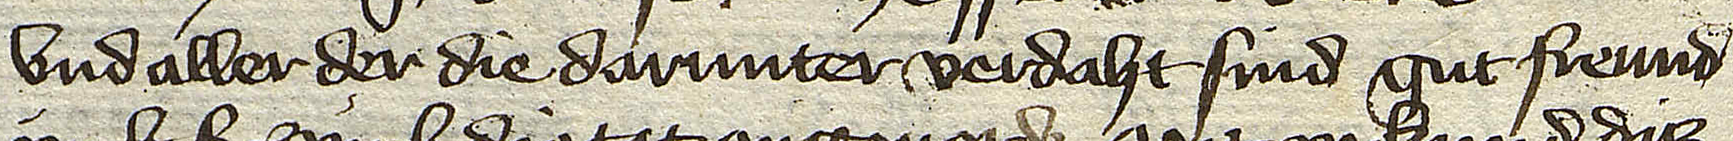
vnd aller der die darunter verdaht ſind gut freund
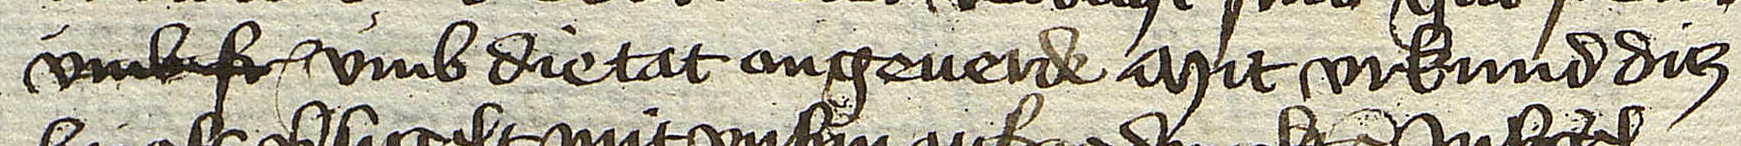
v̈mb fr* v̈mb die tat ongeuerde Mit vrkund dicʒ
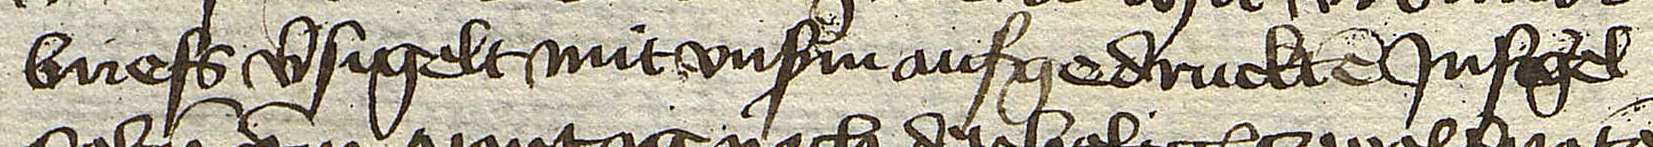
briefs v*ſigelt mit vnſ*m aufgedruckte* Inſigel
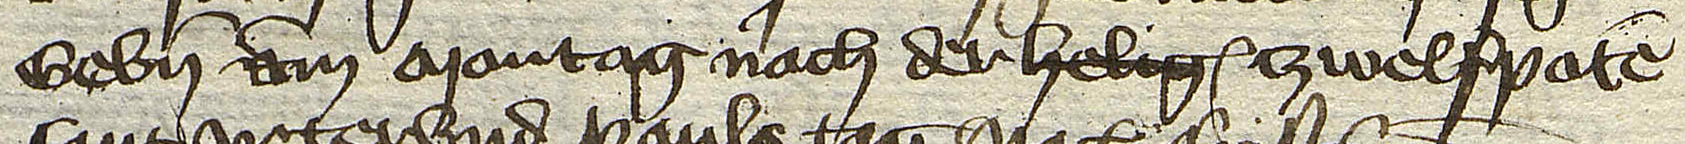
Geb*n am Montag nach der helig* cʒwelfpote*
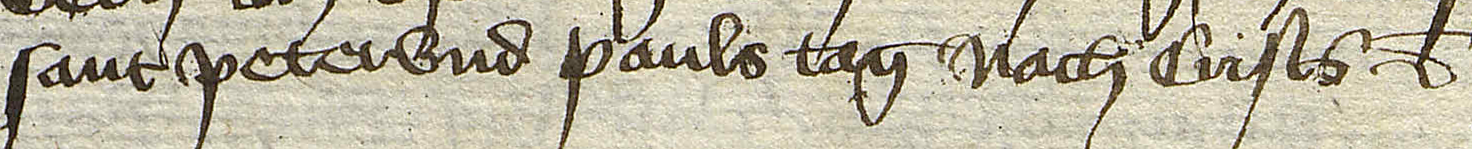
ſant peter vnd pauls tag nach Criſts ec*
